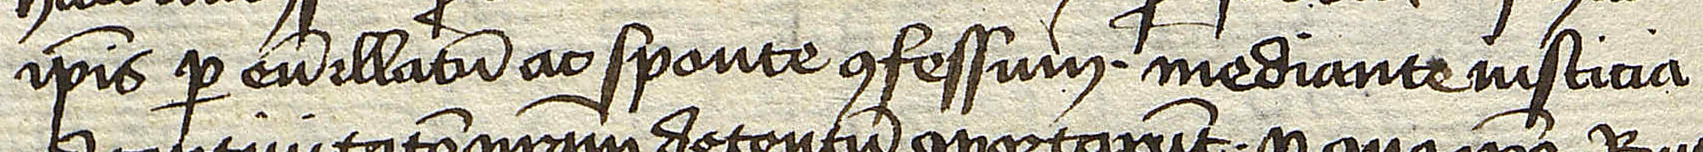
ip*is p* eu* illatu* ac ſponte *feſſum . mediante iuſticia
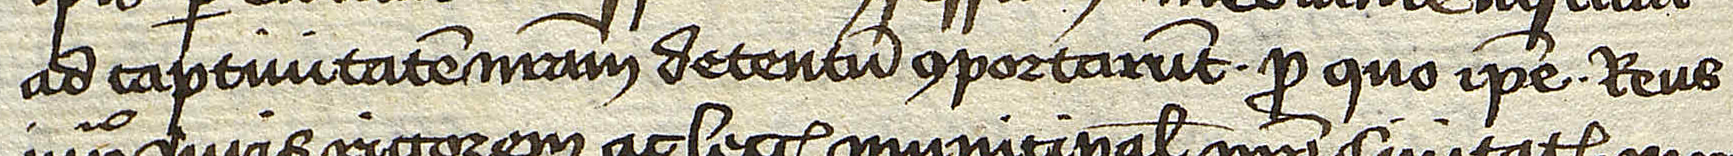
ad captiuitate* n*ram detentu* *portaru*t . p* quo ip*e . Reus
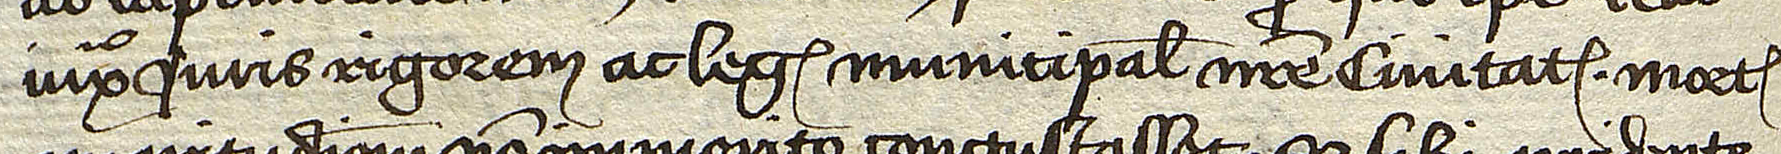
iux* Iuris rigorem ac leg* municipal* n*re Ciuitat* . mort*
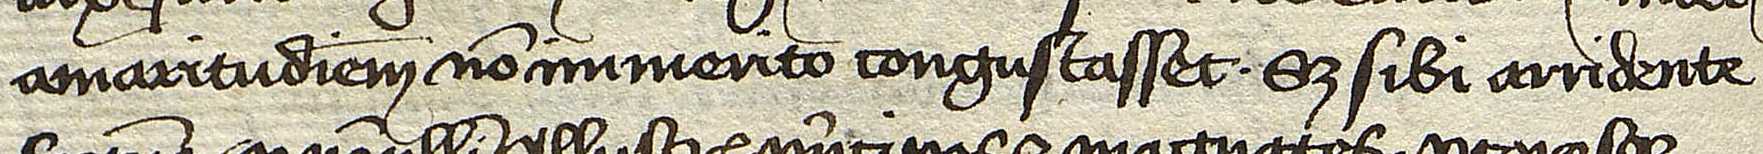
amaritudi*em no* immerito conguſtaſſet . S* ſibi arridente
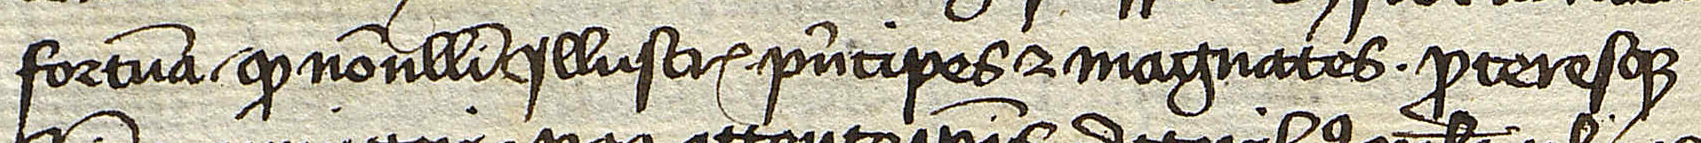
fortu*a / q* no*nulli Illuſtr* p*ncipes @ magnates p*cereſq*
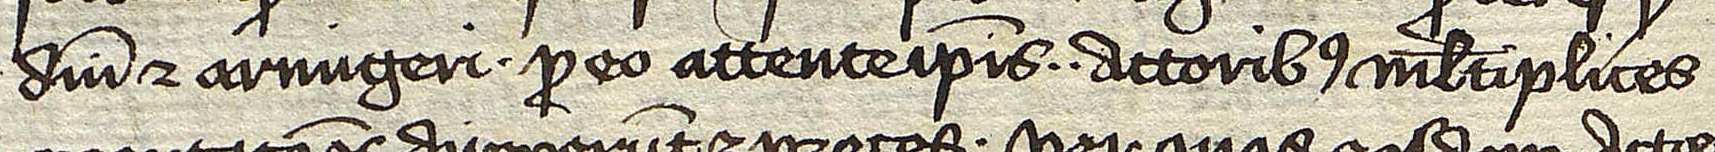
d*ni @ armigeri . p* eo attente ip*is . . Actorib* m*ltiplices
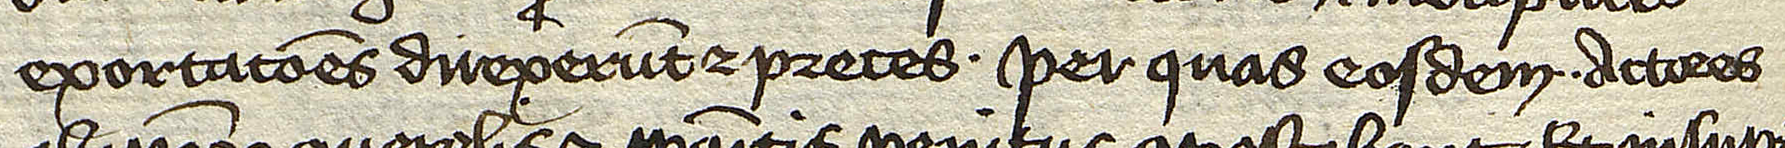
exortat*o*es direxeru*t @ preces . Per quas eoſdem . . Actores
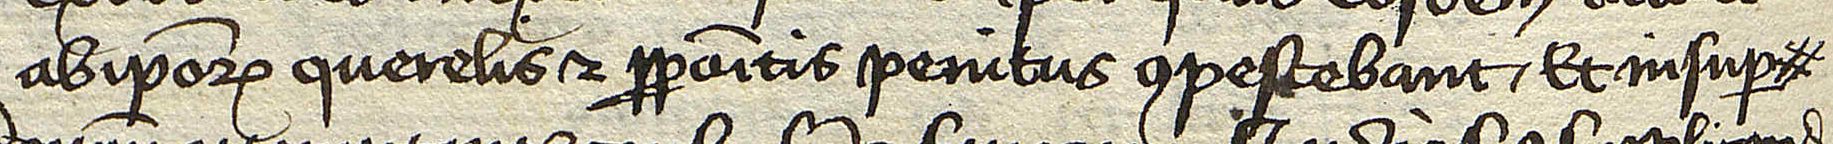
ab ip*or* querelis @ p*po*itis penitus *peſcebant / Et inſup*
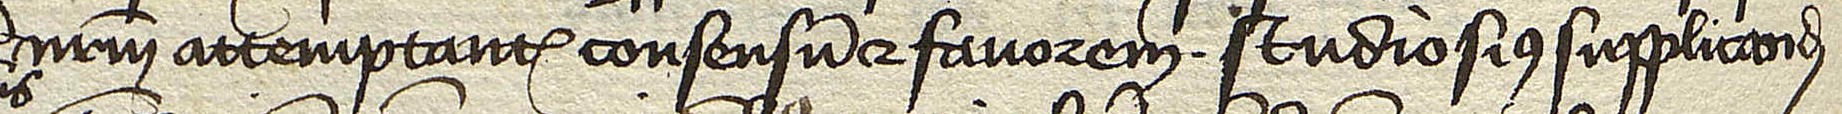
n*r*m attemptant* conſenſu* @ fauorem ſtudioſi* ſupplicand*
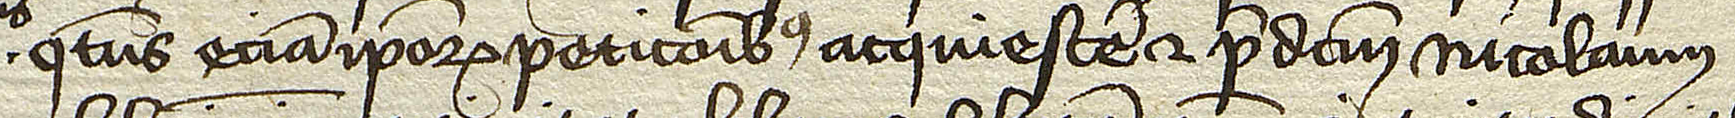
q*t*us ecia* ipor* peticionib* acquieſce* @ p*d*c*m Nicolaum
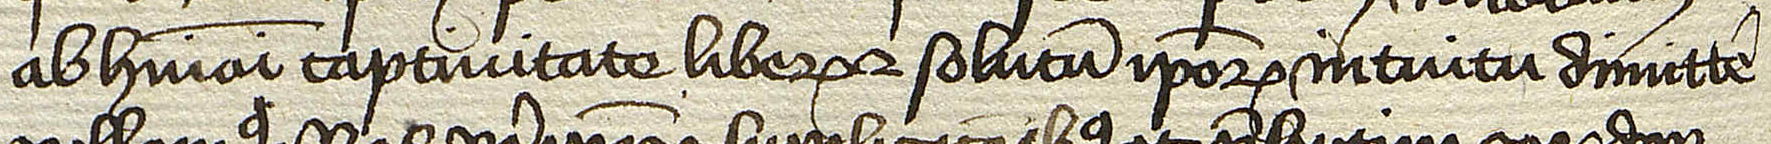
ab hui*o*i captiuitate libe* @ ſolutu* ip*o* intuitu dimitte*
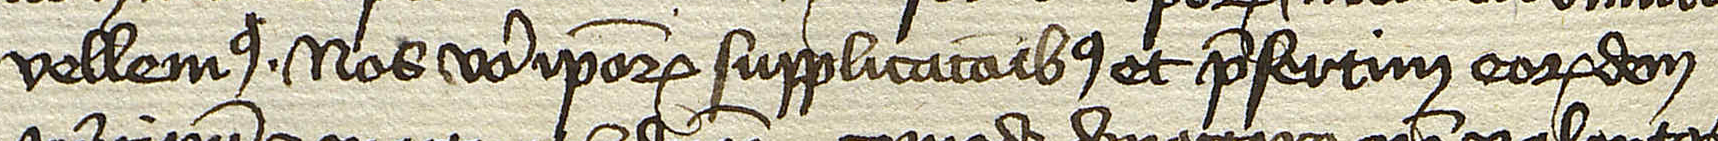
vellem* . Nos v*o ip*or* ſupplicatio*ib* et p*ſertim eo*dem
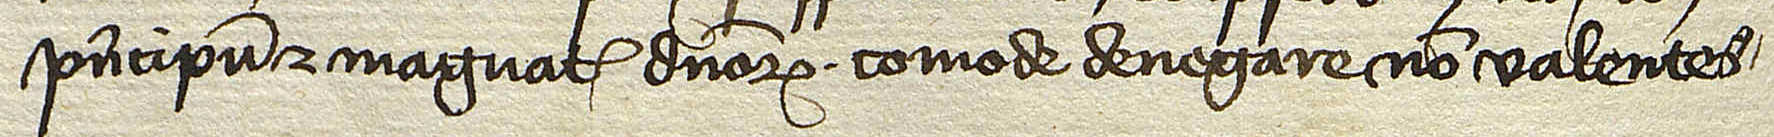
p*ncipu* @ magnat* d*no* . comode denegare no* valentes /
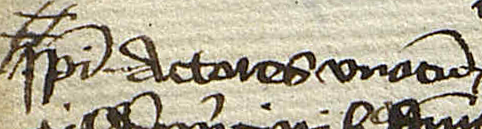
Ip*i* . . Actores vnacu*
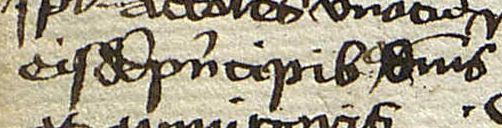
eiſde* p*ncipib* d*nis
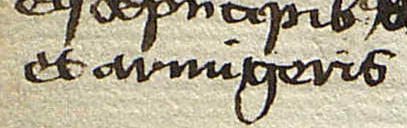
et armigeris
